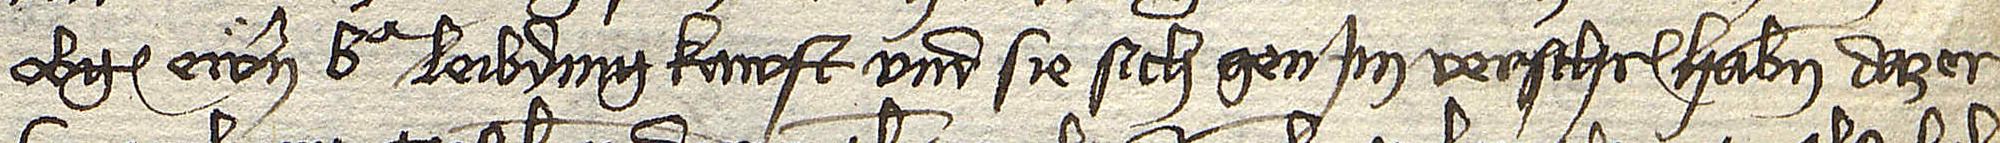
obg* eẅ*n b* / leibding kawft vnd ſie ſich gen Im verſchr* habn* daʒ er
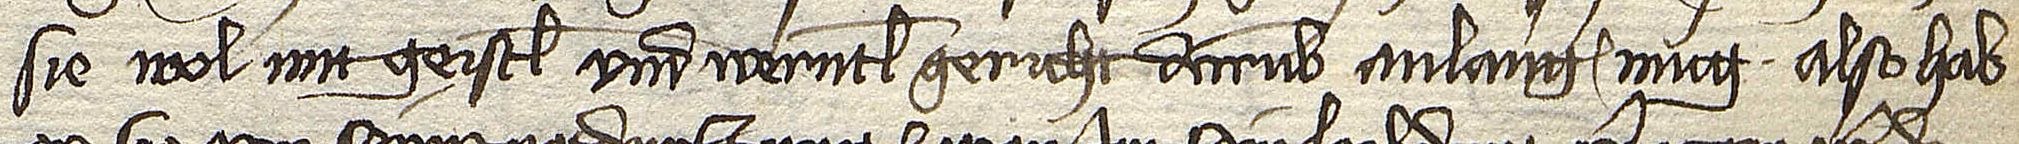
ſie wol mit geiſtl* vnd werntl* gericht darub* anlang* mug . alſo hab
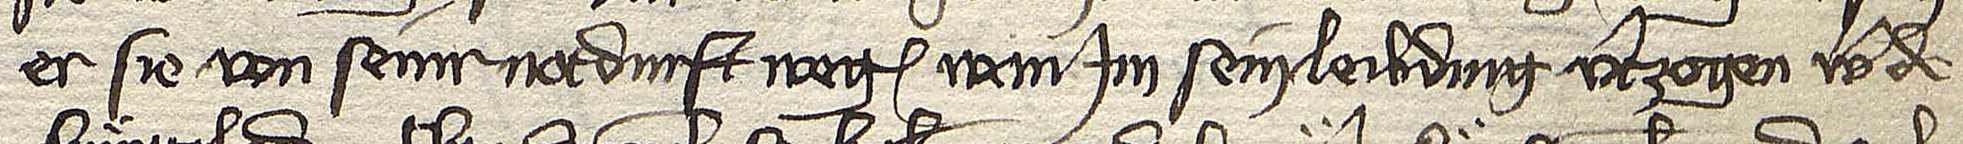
er ſie von ſeinr notdurft weg* wan Im ſein leibding v*cʒogen w*de
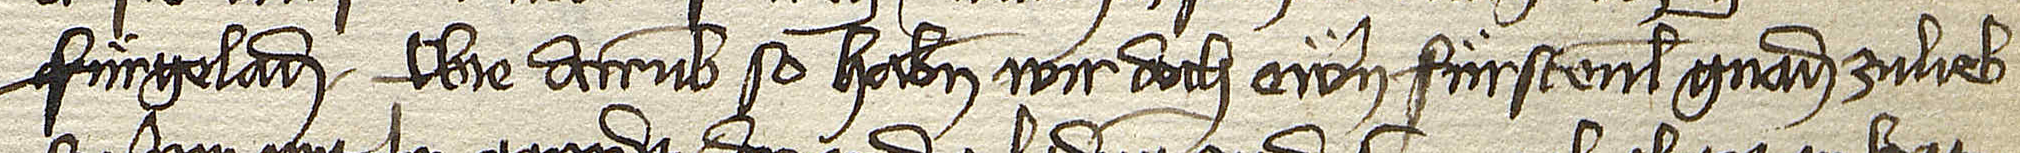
fürgelad* / wie darub* ſo habn* wir doch eẅ*n fürſtenl* gnad* ʒulieb
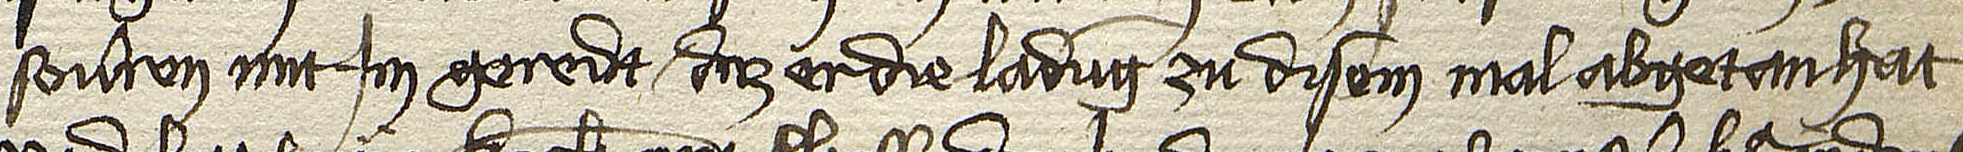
ſou*ren mit Im geredt / daʒ er die ladu*g ʒu diſem mal abgetan hat
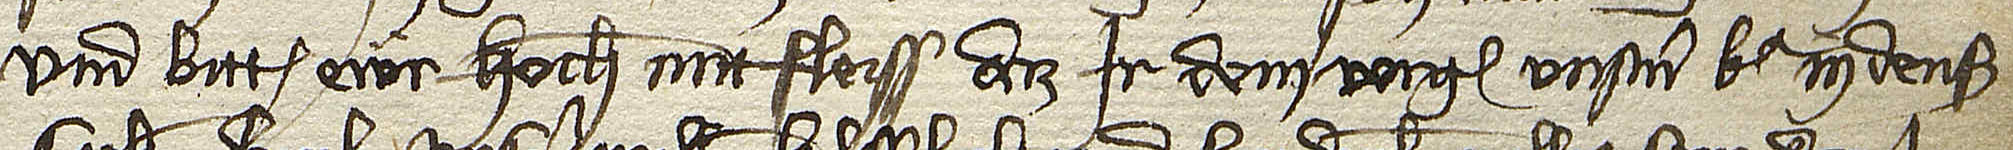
vnd bitt* eẅr hoch* mit fleiſſ daʒ Ir dem vorg* vnſm* b* in denſ*
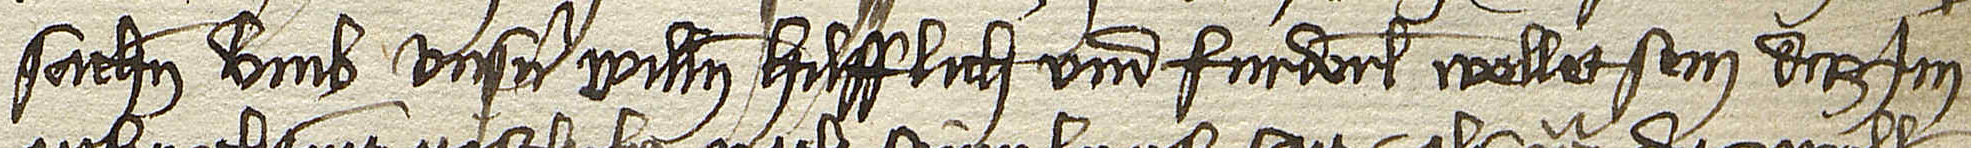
ſachn* vmb vnſn* willn* hilfflich vnd furderl* wellet ſein daʒ Im
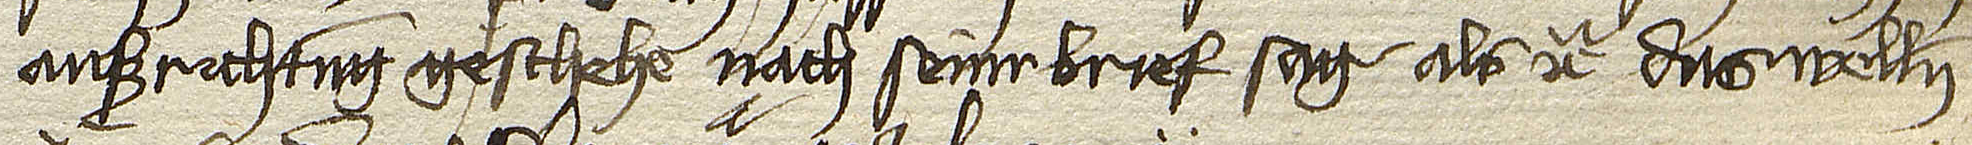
auſʒrichtu*g geſchehe nach ſeinr brief ſag / als ec* Das welln*
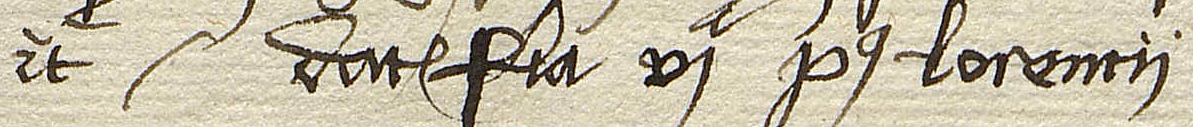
ec* / Dat* fi*a vi* p* Lorentii
